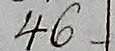46
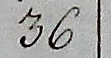36
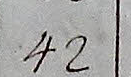42
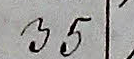35
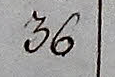36
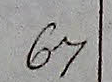67
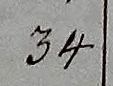34
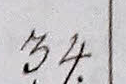34.
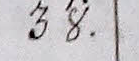38.
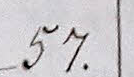57.
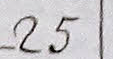25
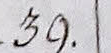39.
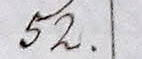52.
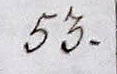53
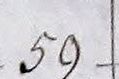59
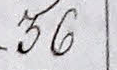36
